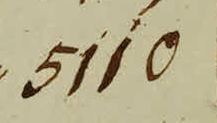5110
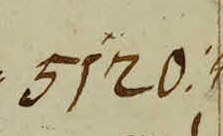5120
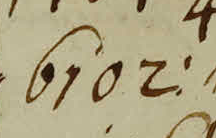6102.
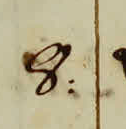8:
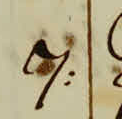7;
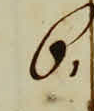6
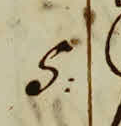5:
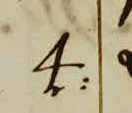4:
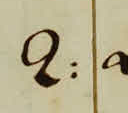2:
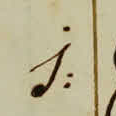1:
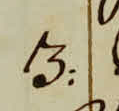3:
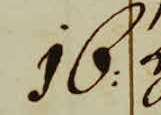16:
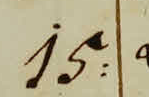15:
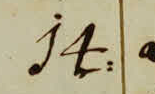14:
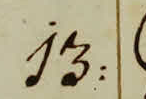13:
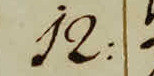12:
